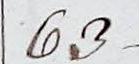63
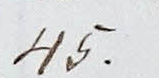45.
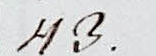43.
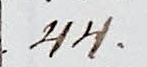44
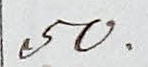50
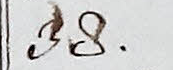38.
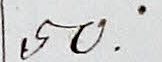50.
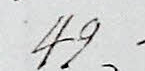49
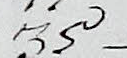35
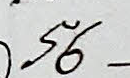56
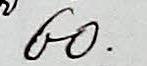60.
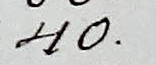40.
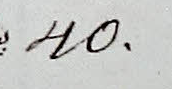40.
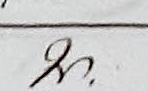2.
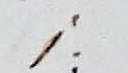1.
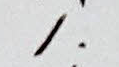1.
